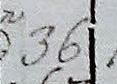36
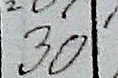30
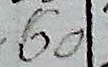60
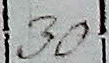30
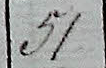51
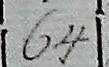64
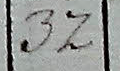32
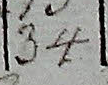34
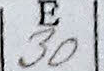30
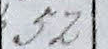52
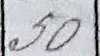50
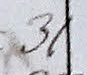31
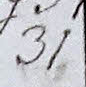31
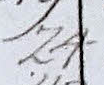24
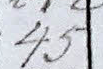45
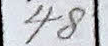48
